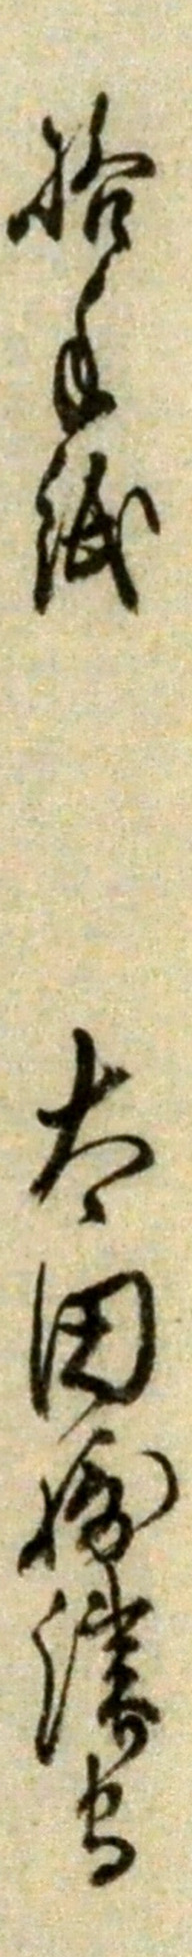給手紙太田攝津守
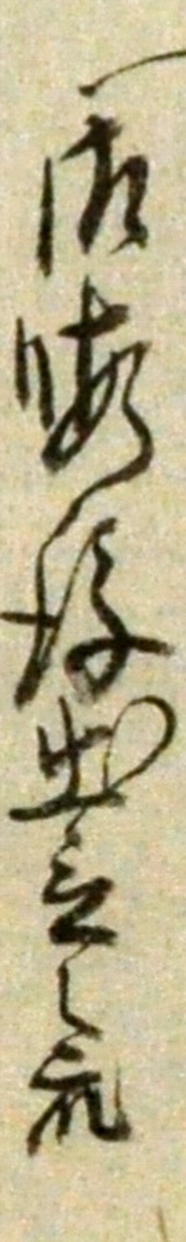御暇後出立之衆
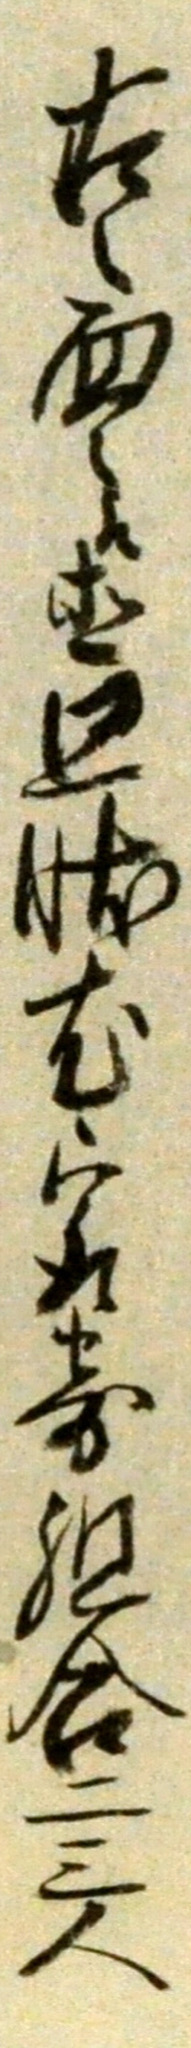右之面々え直廻状尤最寄組合二三人
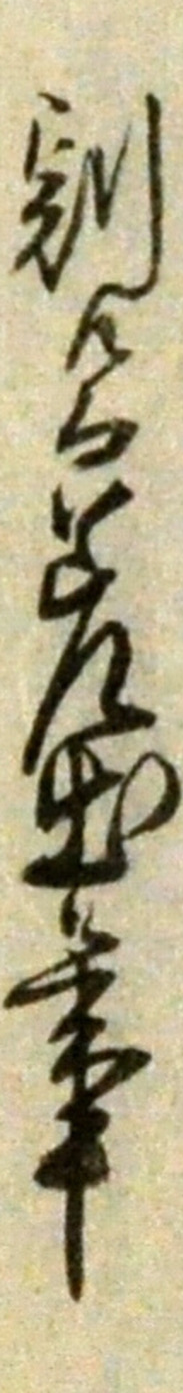割に而差出候事

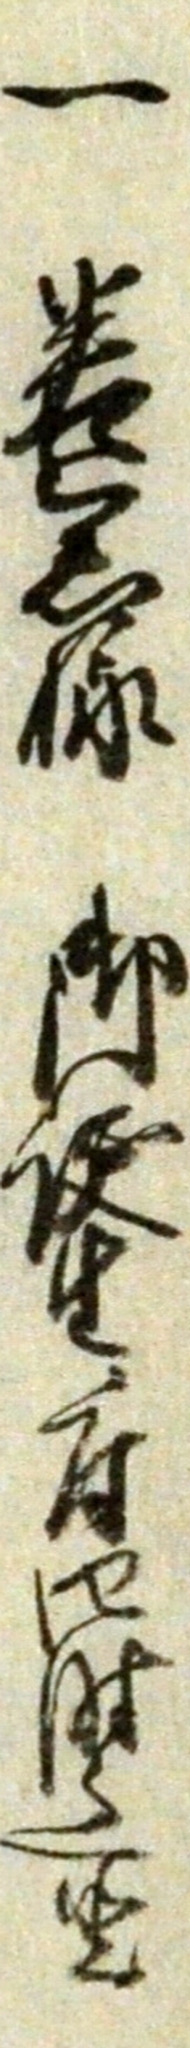一若君様御誕生ニ付四時過登
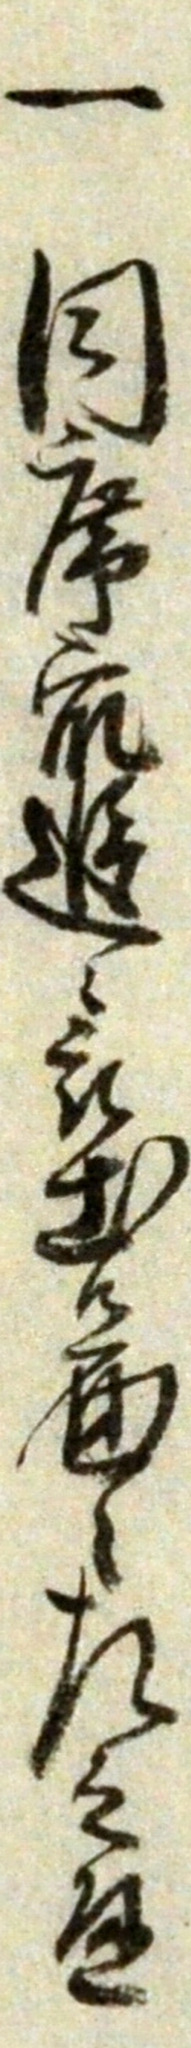一同席衆追々被出候面々左之通
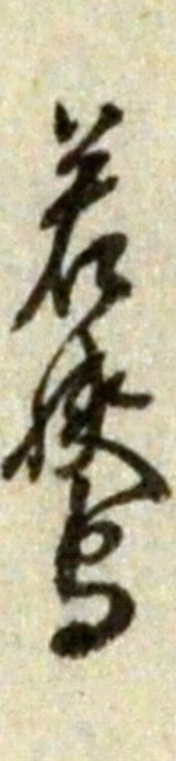若狭守
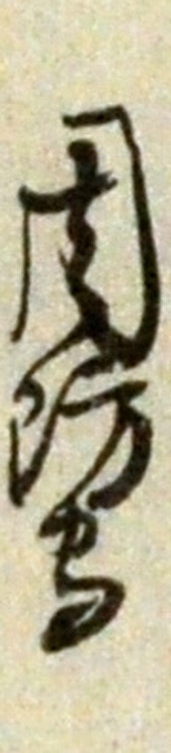周防守
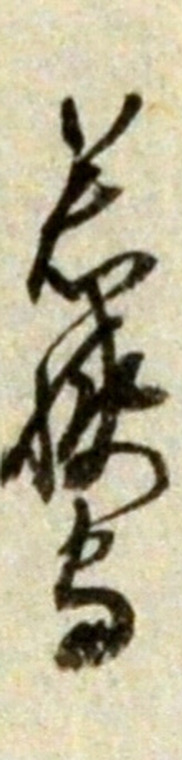若狭守
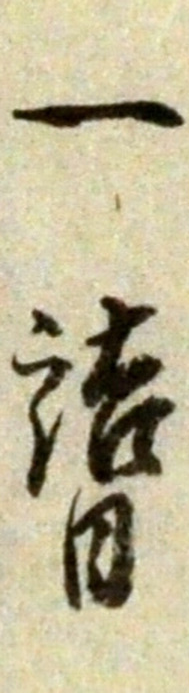一詰日
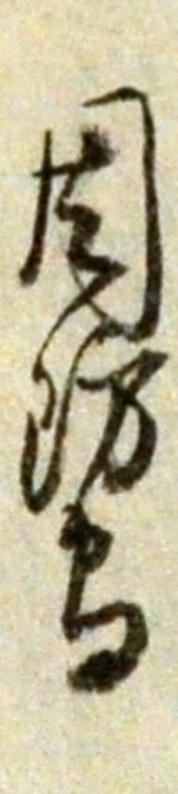周防守
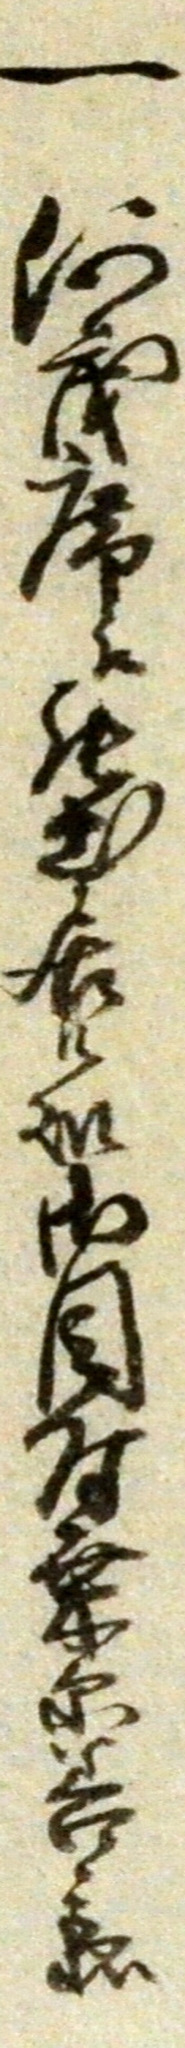一何も席え罷出居候処御目付桑原善兵衛
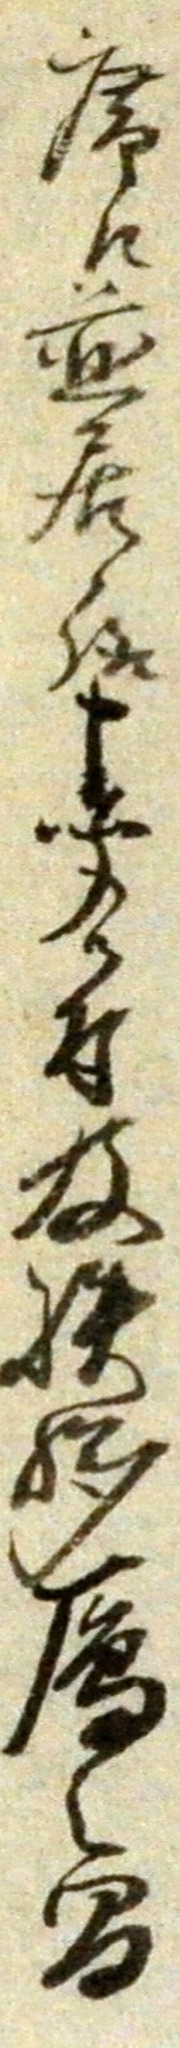席え並居候様申聞候付及挨拶雁之間
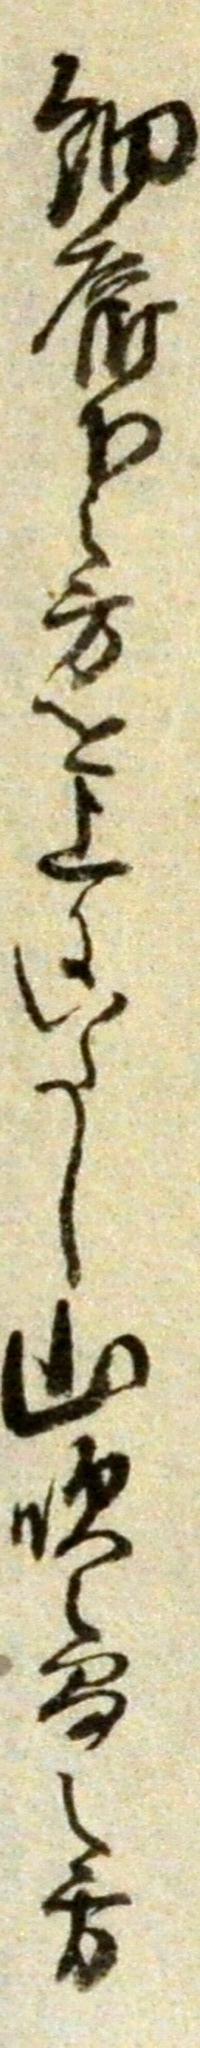細廊下之方を上にいたし山吹之間之方
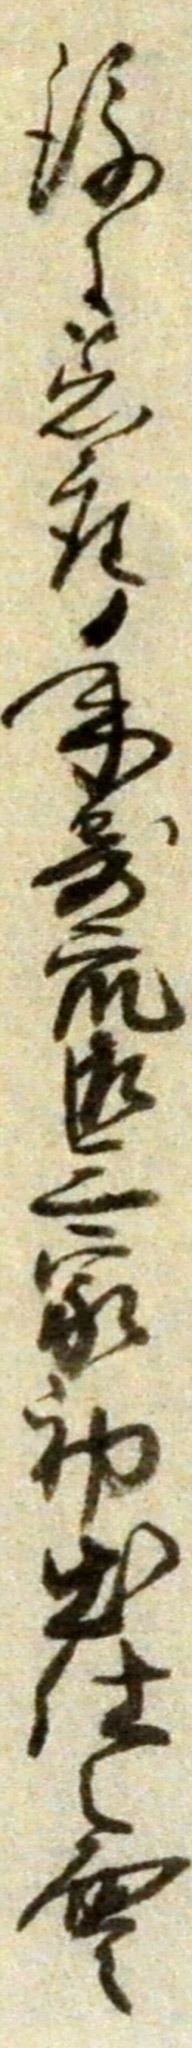後に着座年寄衆御三家初出仕之面々
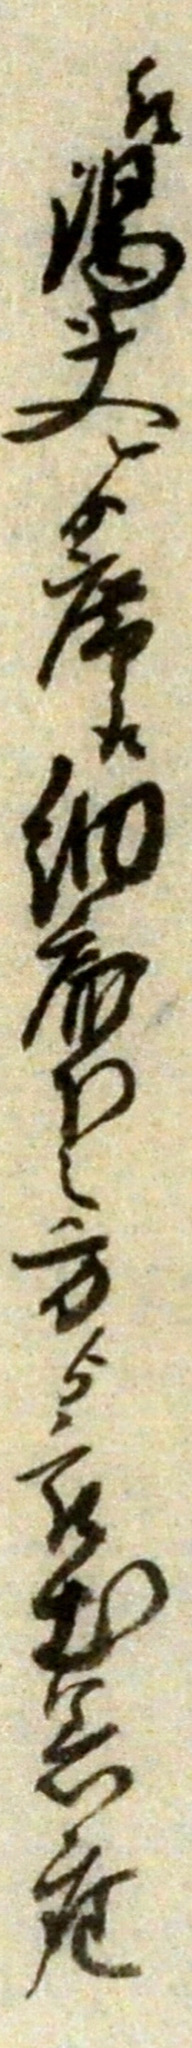え謁夫ゟ席え細廊下之方ゟ罷出着座
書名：若君様（家斉嫡男）誕生諸祝儀ノ節ノ留書外
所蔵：伊那市立高遠町図書館・合同会社AMANE
